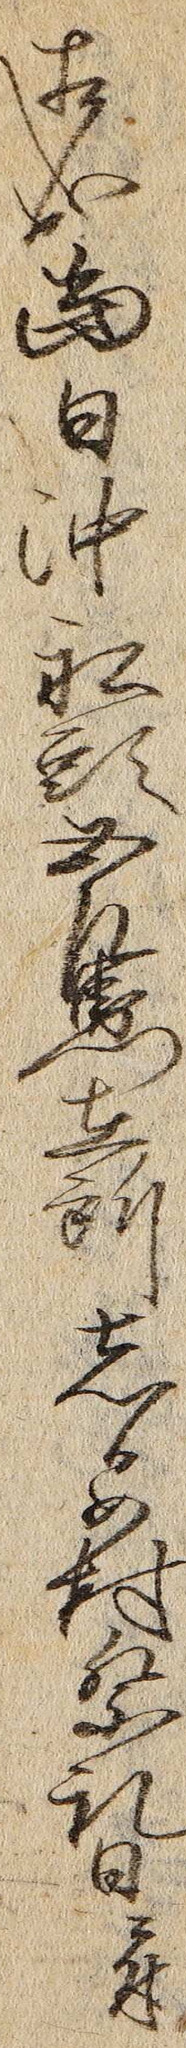相成当日沖船頭五左衛門在所しるめ村祭礼日に付
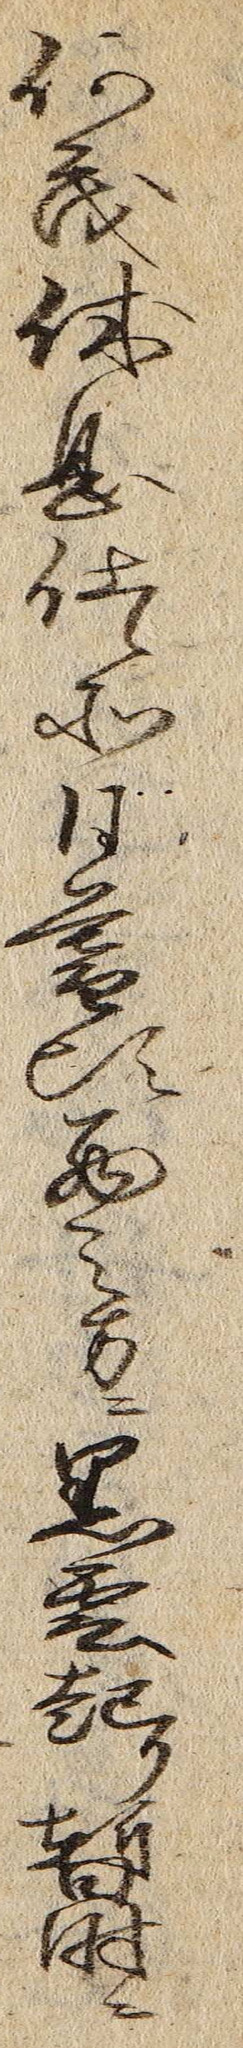何も休息仕候所日暮頃西の方に黒雲起り暫時に
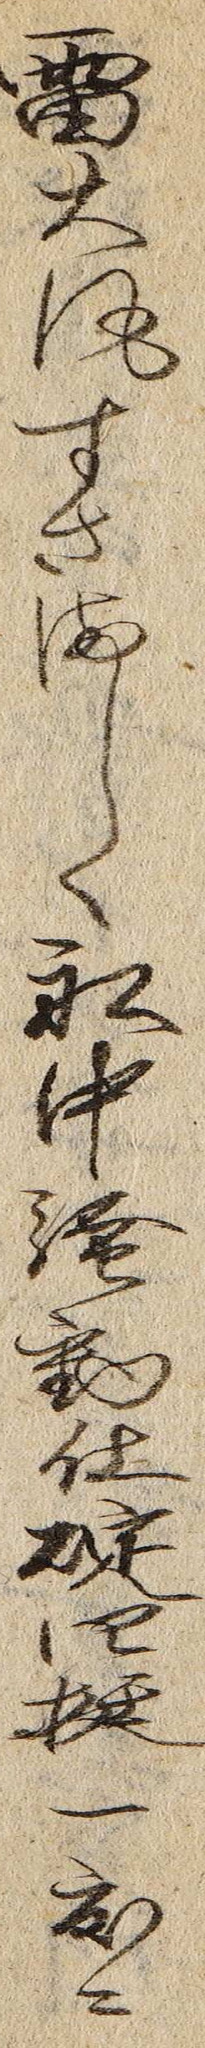雷大風すさましく船中騒動仕碇四挺一度に
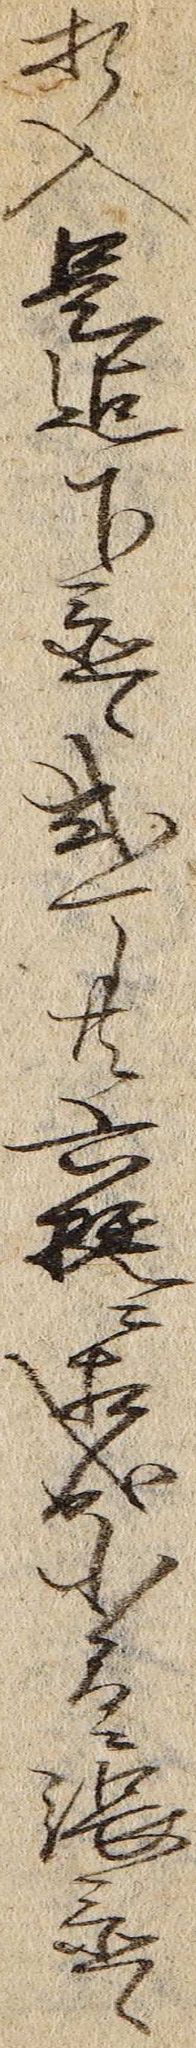打入是まで下置候二丁とも六挺に相成小間に張置く
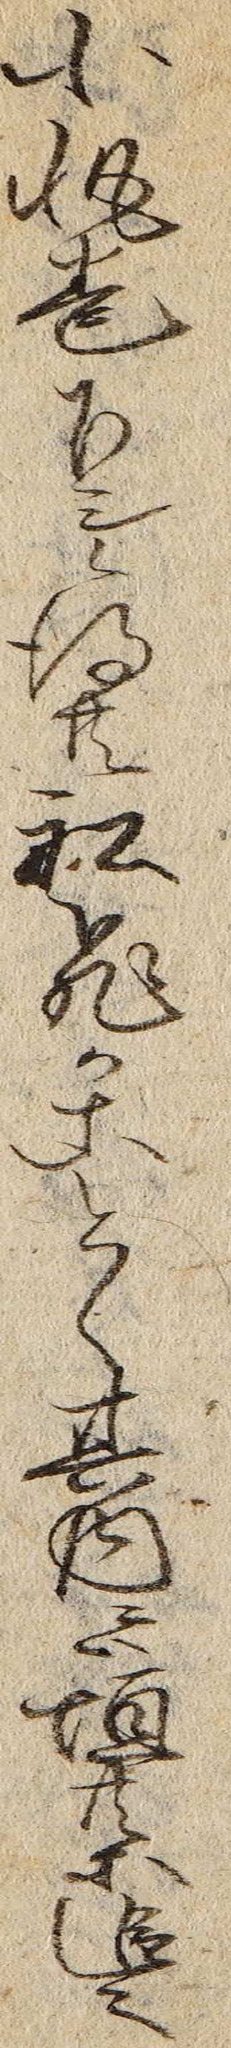小帆巻下し候得ども船飛かことく其内には垣ども等追々
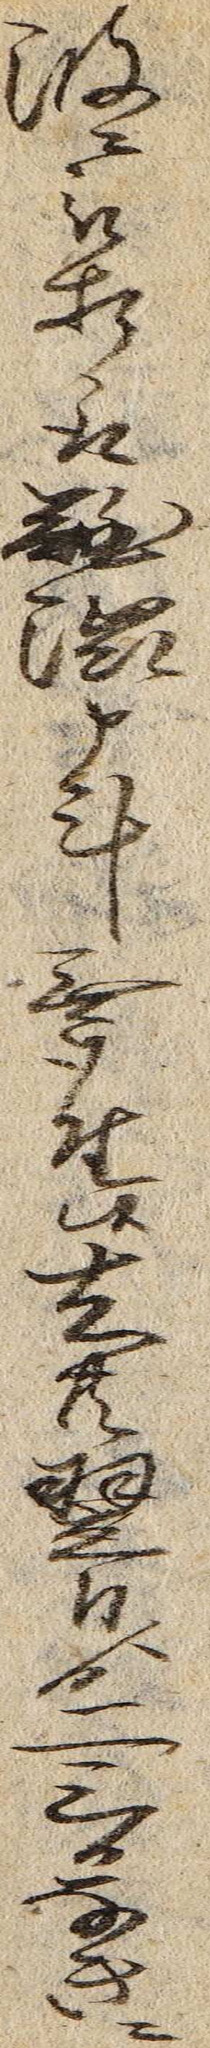波に被打取難渋申斗無御座候去とも翌日より二三日なきに
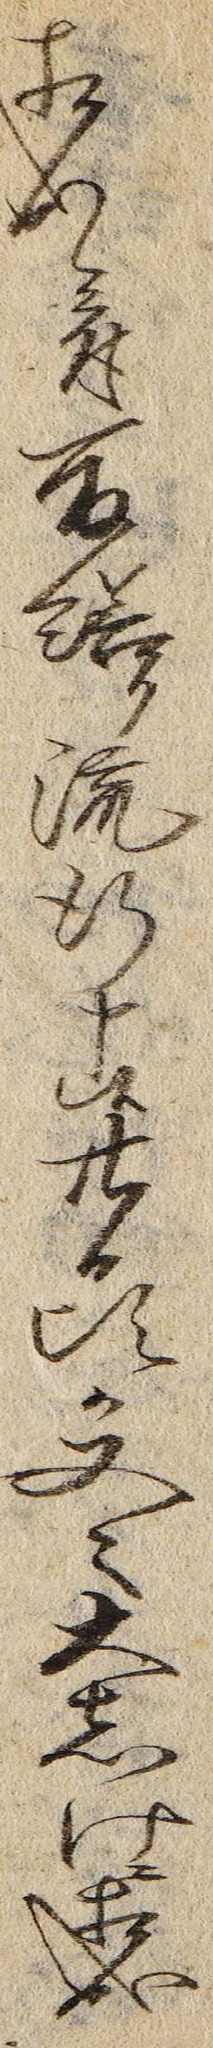相成候に付取繕り流行申候二十日頃か又々大しけに相成
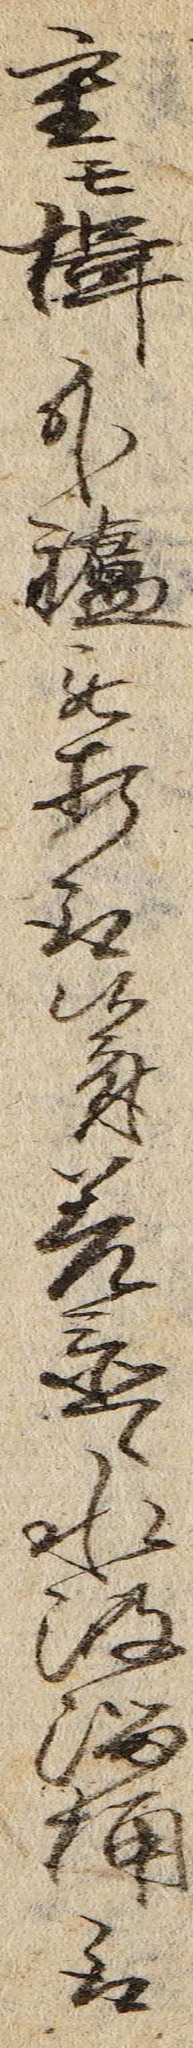重モ楫外艫被打取候に付差置候水汲溜桶取
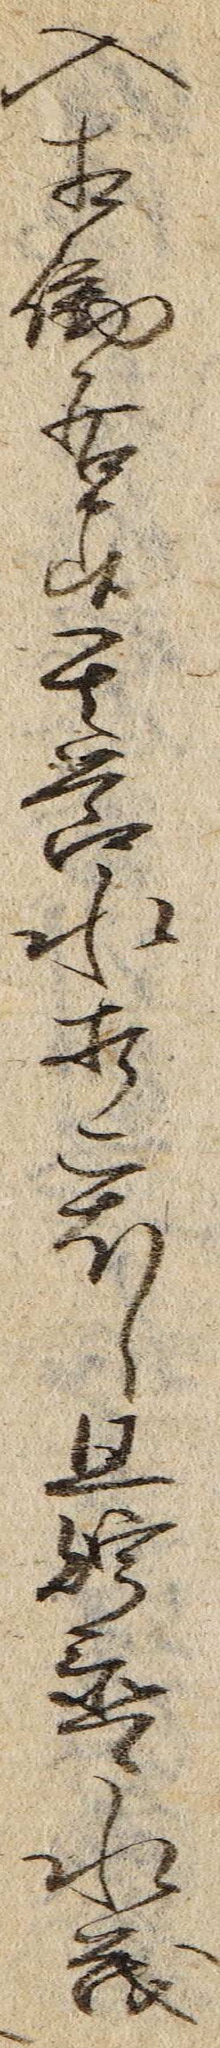入相働居申候其節水打こほし且貯置候水も
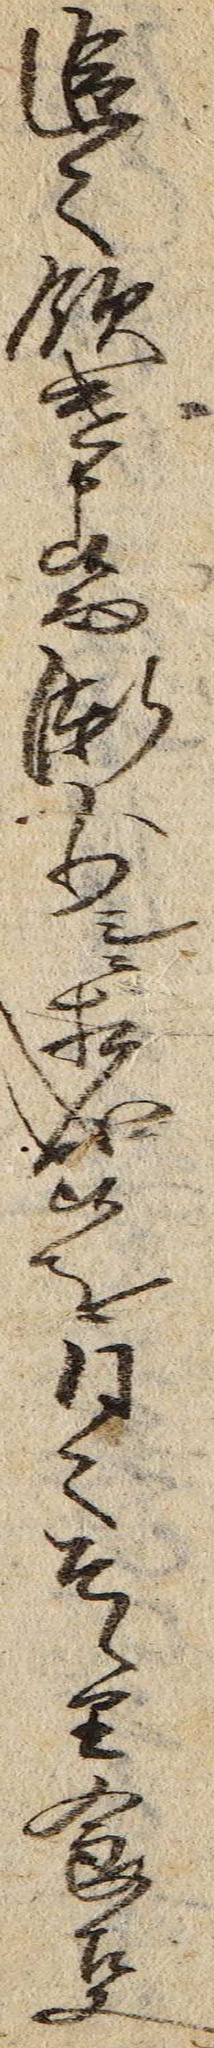追々飲遣申候て漸少しに相成候を日々そゝり食事
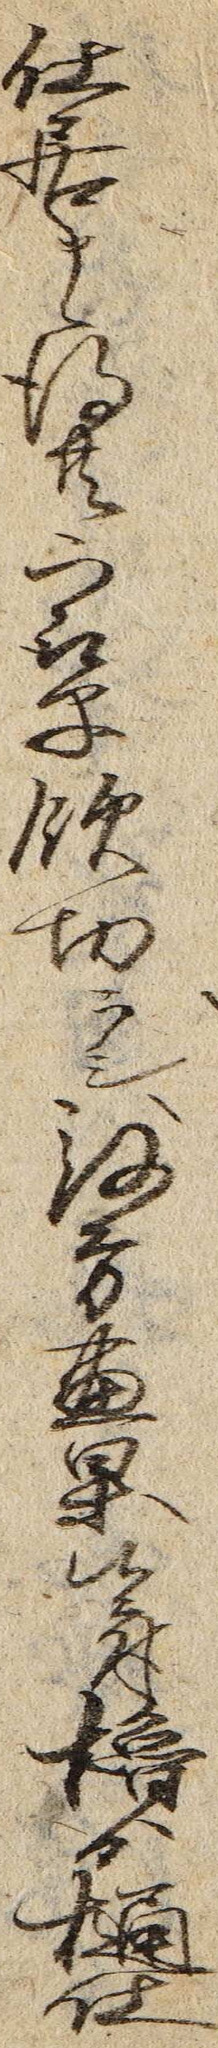仕居申候得ども最早飲切らし致方尽果候に付櫓より桶仕
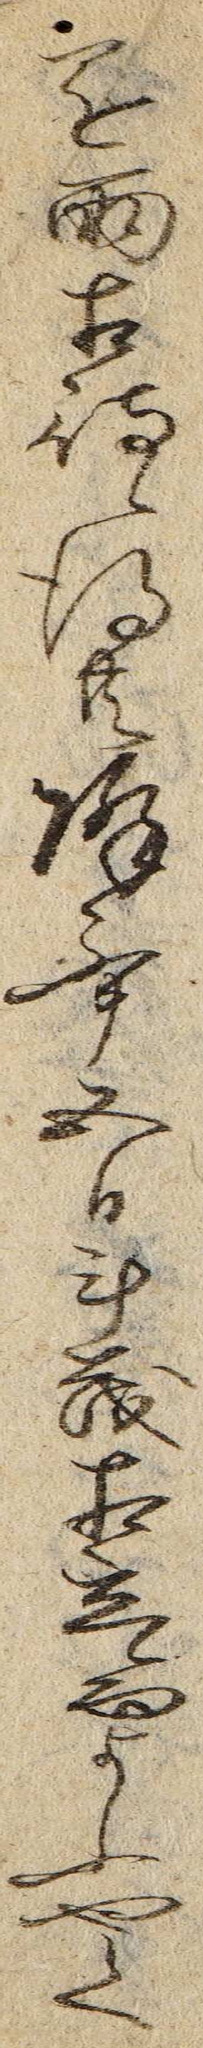懸雨相待候得ども降不申五日斗も相立候てよふやく

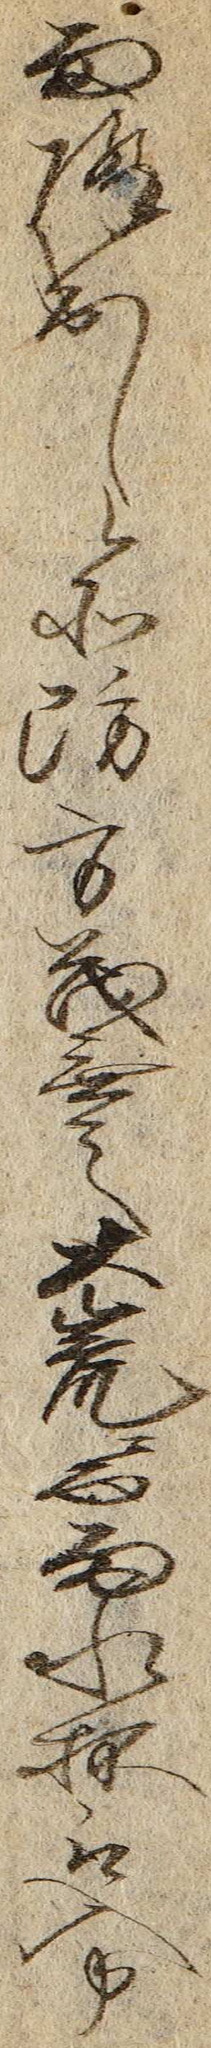雨降出し候所防方も無之大荒にて雨水抔被入申
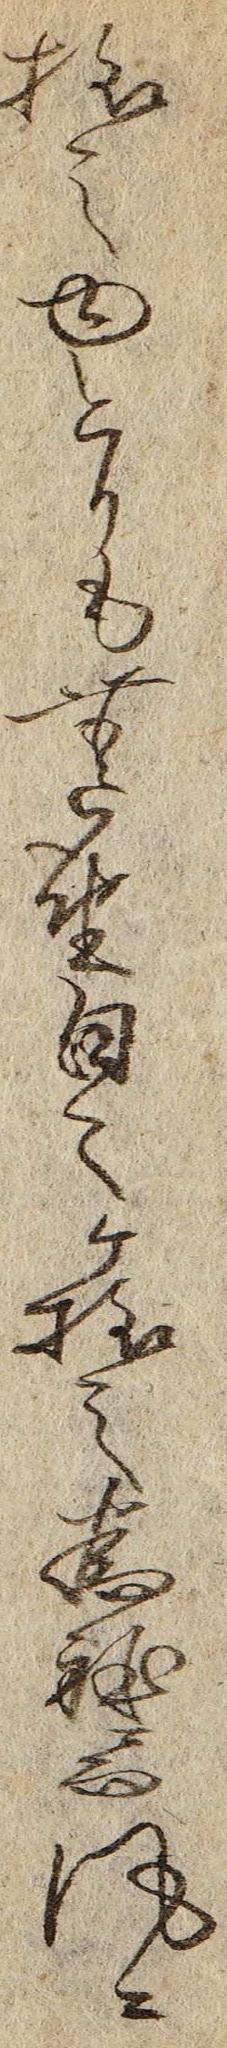様のゆとりも無御座日々ケ様の為体にて風に
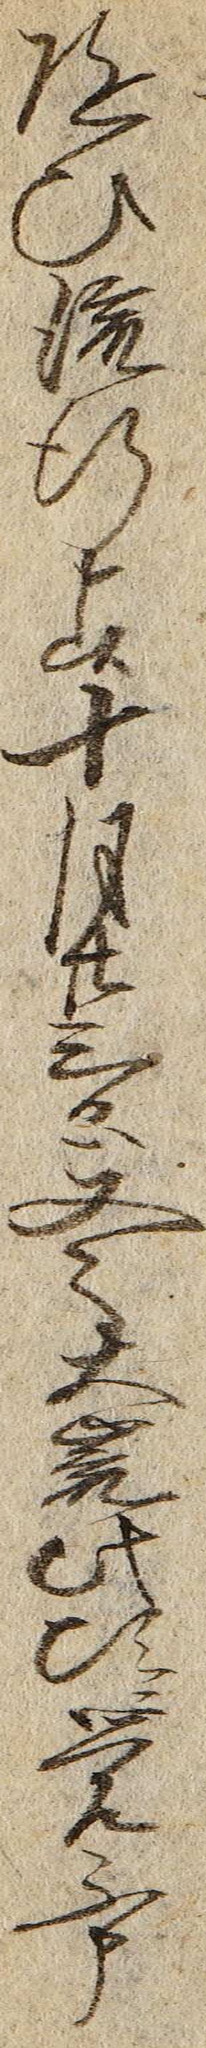随ひ流行申候十月二十三日は又々大荒此頃覚不申
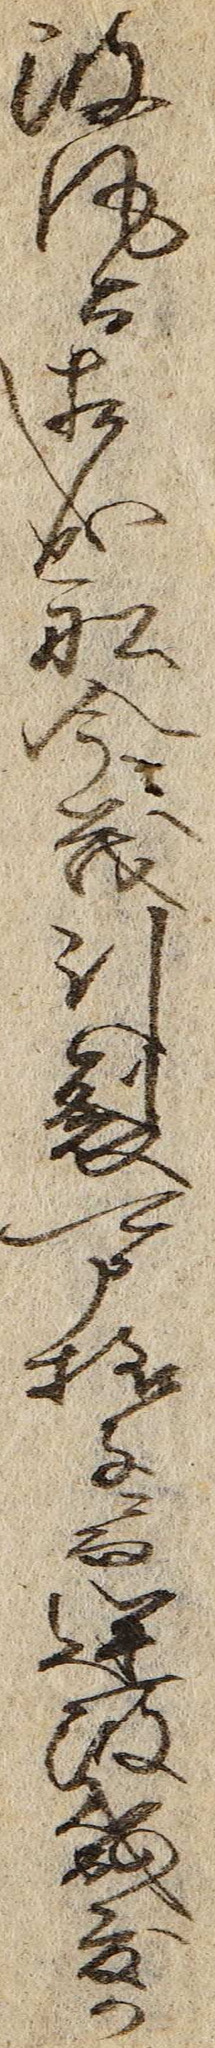波風と相成船今にも引裂可申様子にて逆波幾度か
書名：能登国清兵衛異国江漂流之始末
